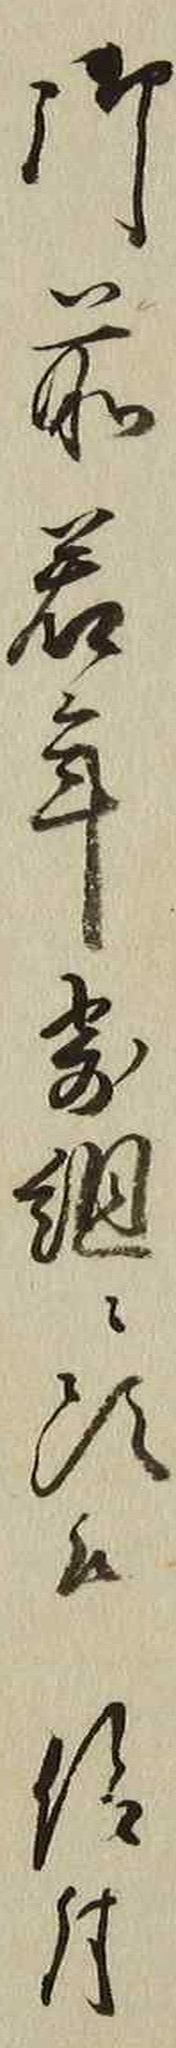御前若年寄組ニ頭被仰付
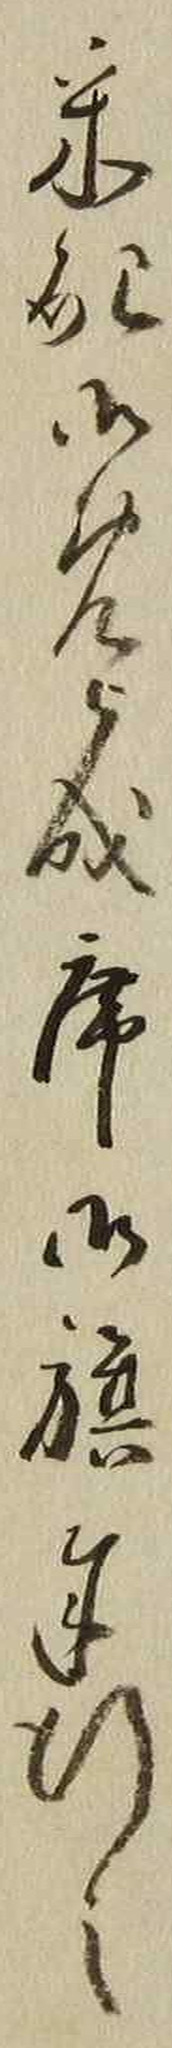采配御免被成席御旗奉行之
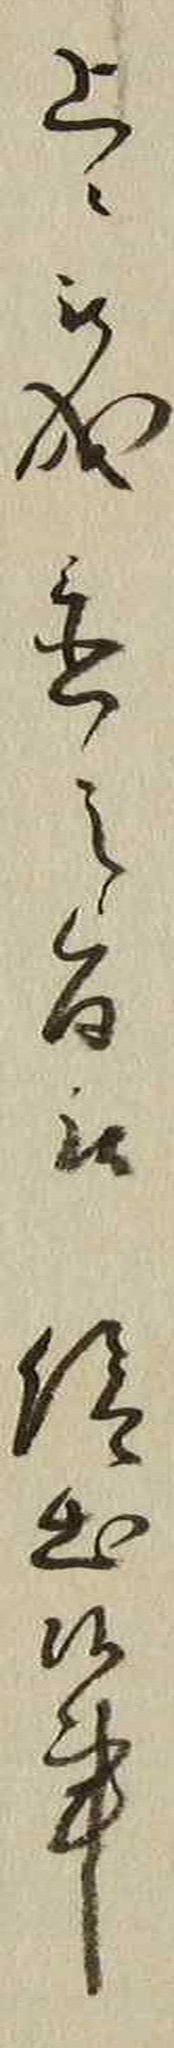上ニ被成置之旨被仰出候事
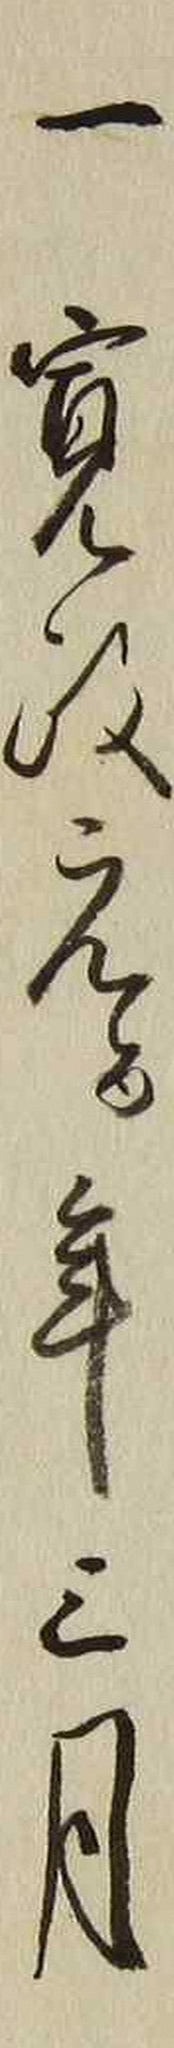一寛改元酉年三月
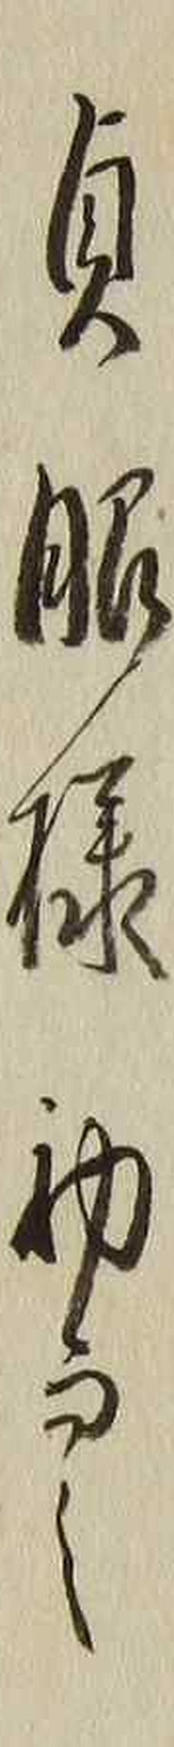貞昭様初而之
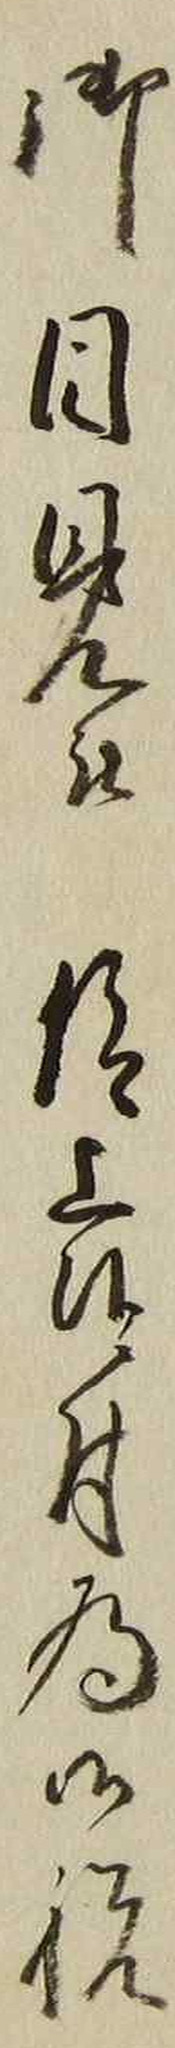御目見被仰上候ニ付為御祝
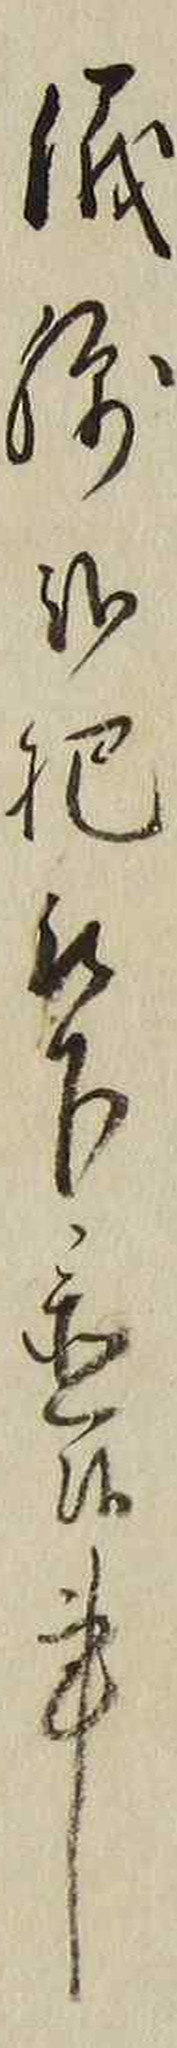儀綿弐肥被下置候事
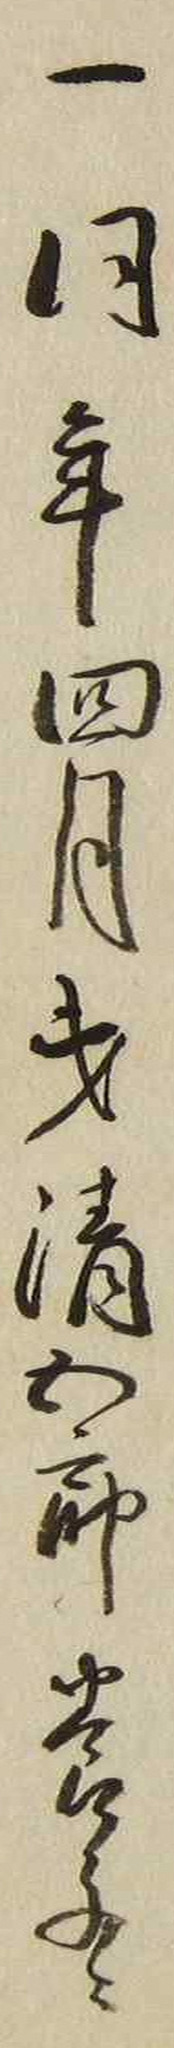一同年四月弟清五郎養子ニ

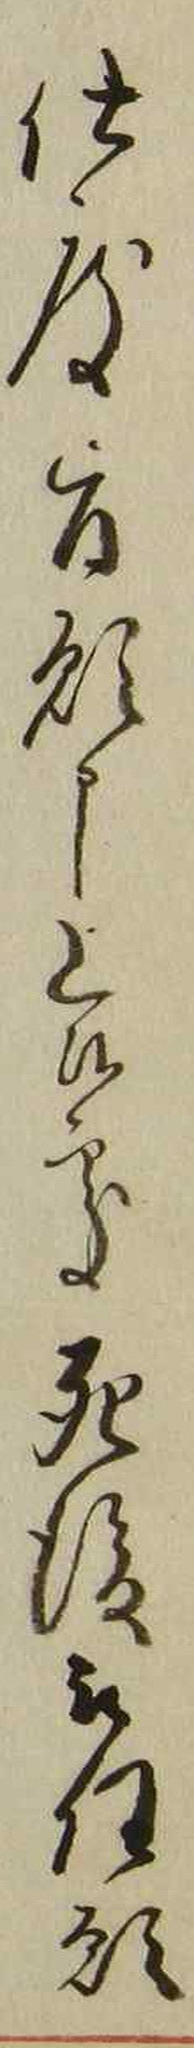仕度旨願申上候処死後被任願
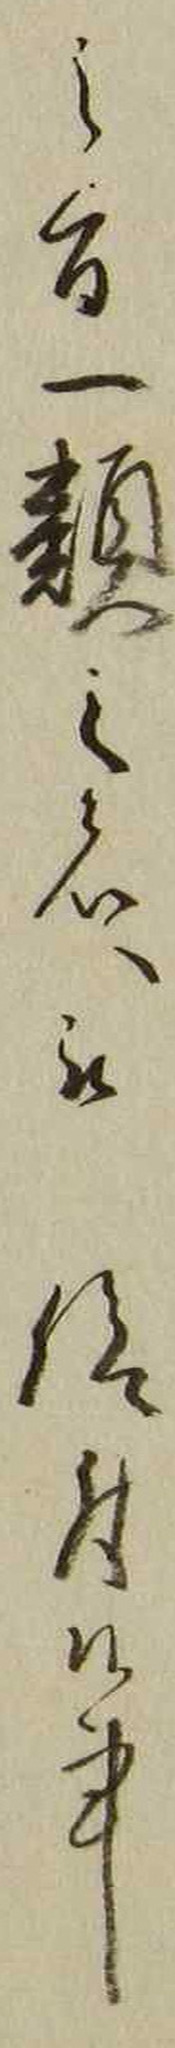之旨一類之者へ被仰付候事
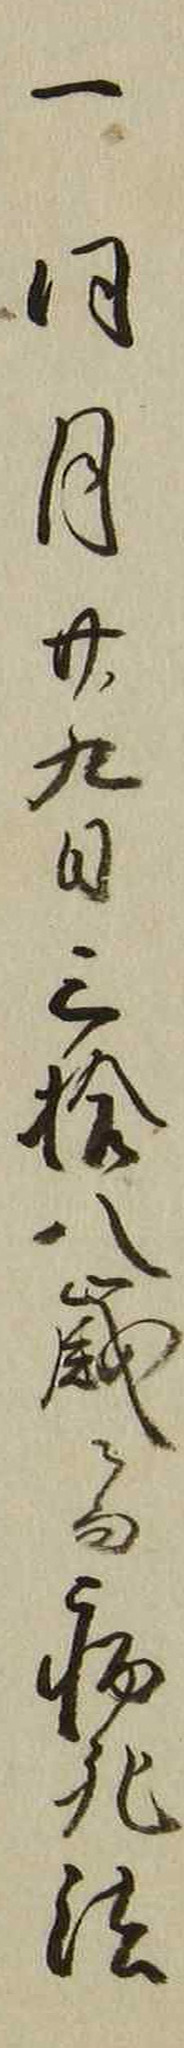一同月廿九日三拾八歳ニ而病死法
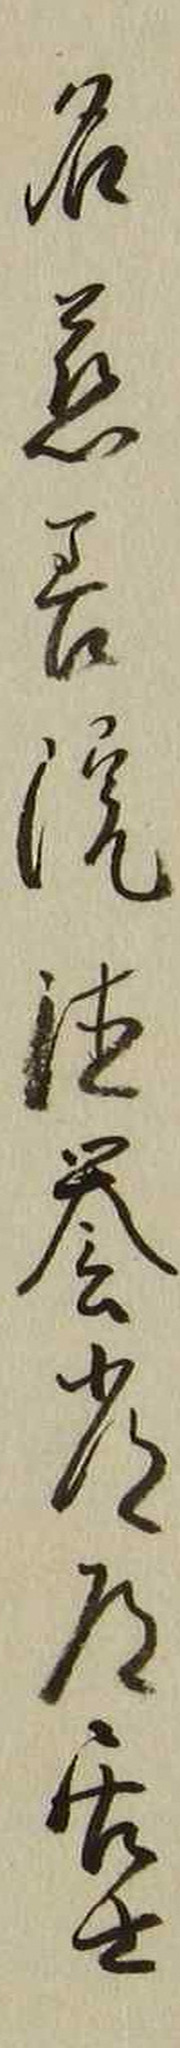名慈善院徳誉常道居士
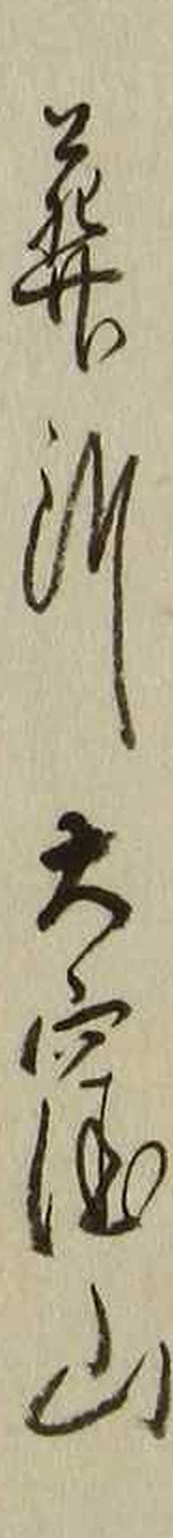葬所大窪山
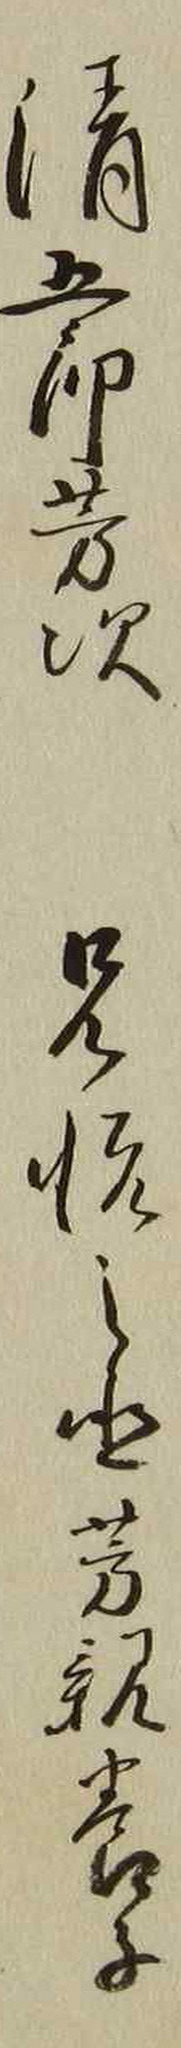清五郎芳次兄悦之丞芳親養子
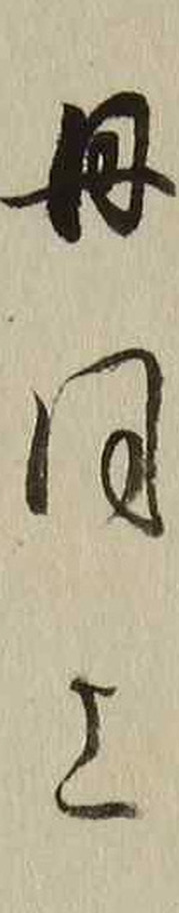母同上
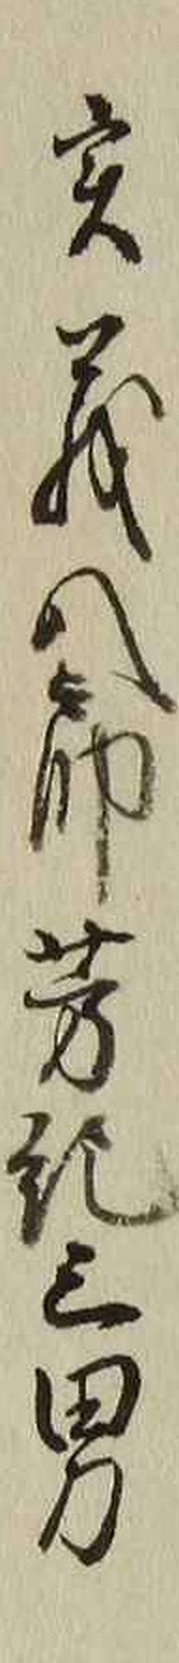実義八郎芳紀三男
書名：諸士系譜　巻之1　い之部1
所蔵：会津若松市立会津図書館
